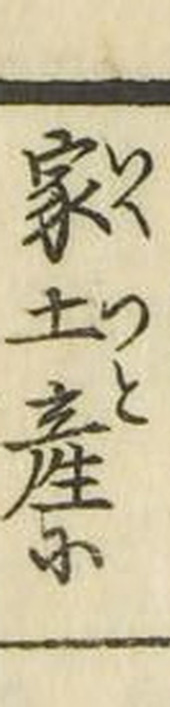家土産に

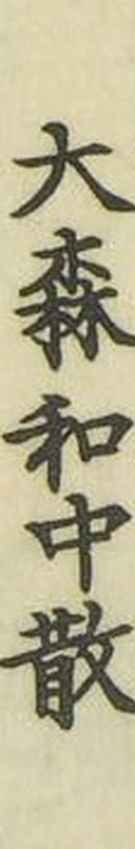大森和中散

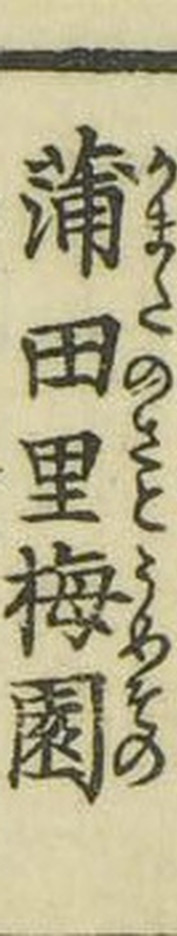蒲田里梅園
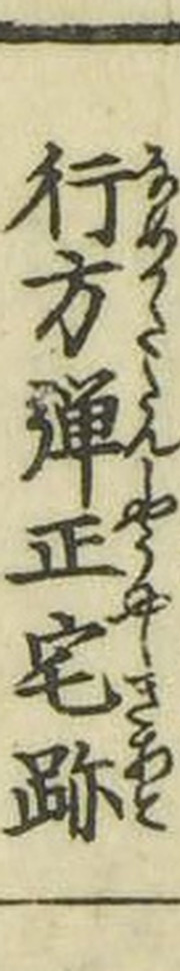行方弾正宅跡

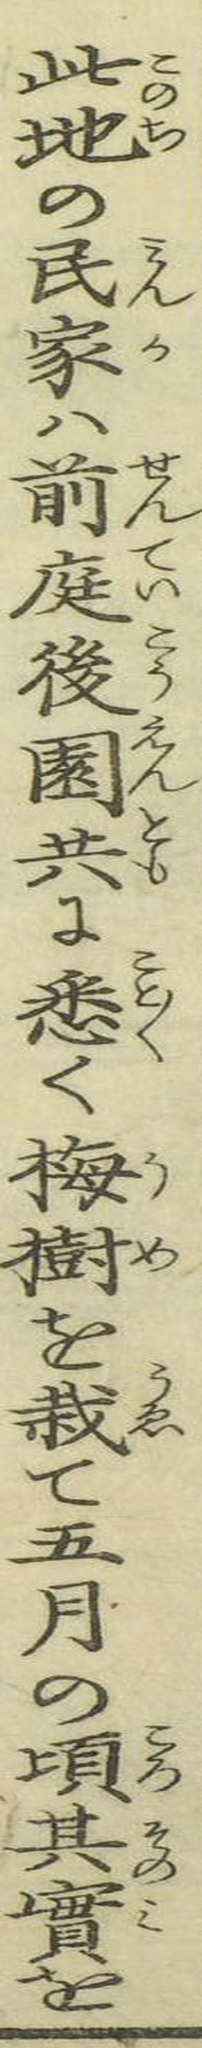此地の民家は前庭後園共に悉く梅樹を栽て五月の頃其實を
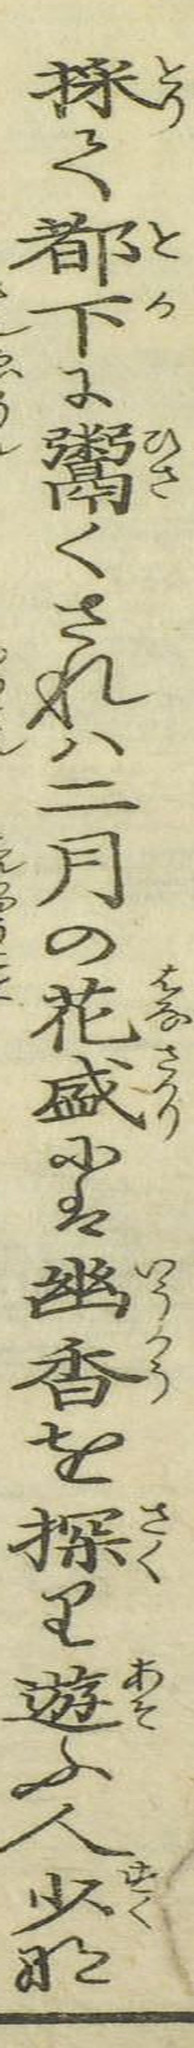採て都下に鬻くされは二月の花盛には幽香を探り遊ふ人少な
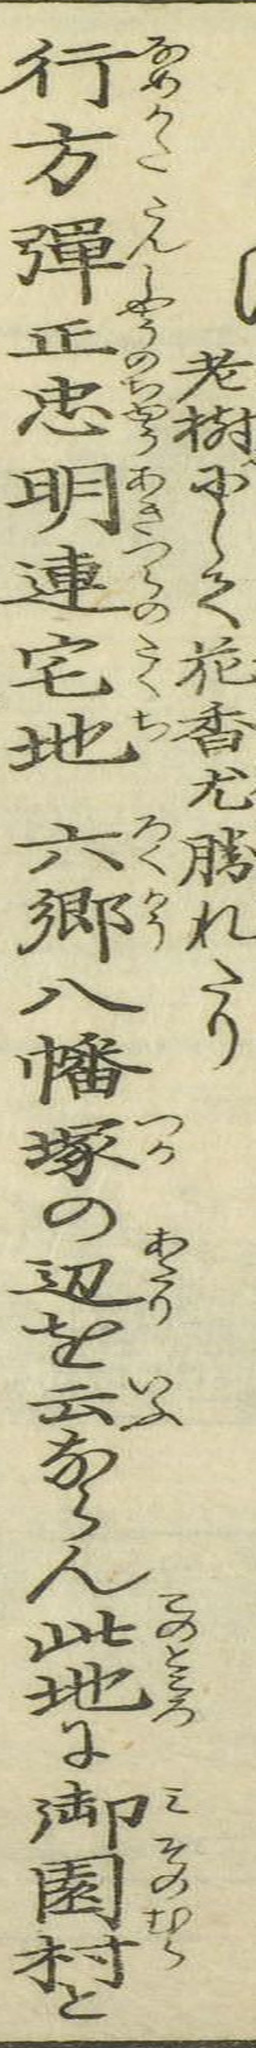行方彈正忠明連宅地六郷八幡塚の辺を云ならん此地に御園村と
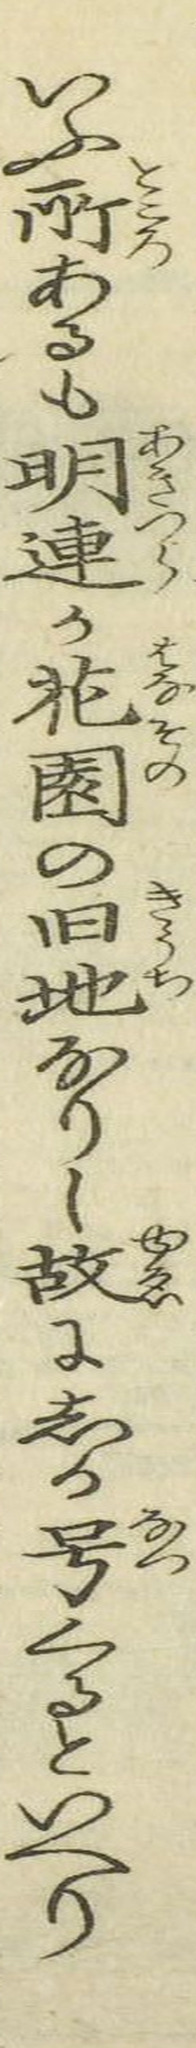いふ所あるも明連か花園の旧地なりし故にしか号くるといへり
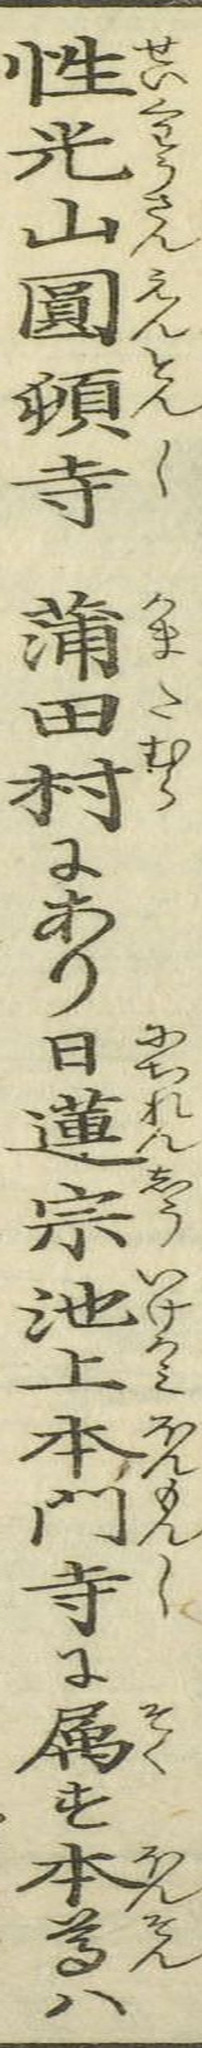性光山圓頓寺蒲田村にあり日蓮宗池上本門寺に属す本尊は
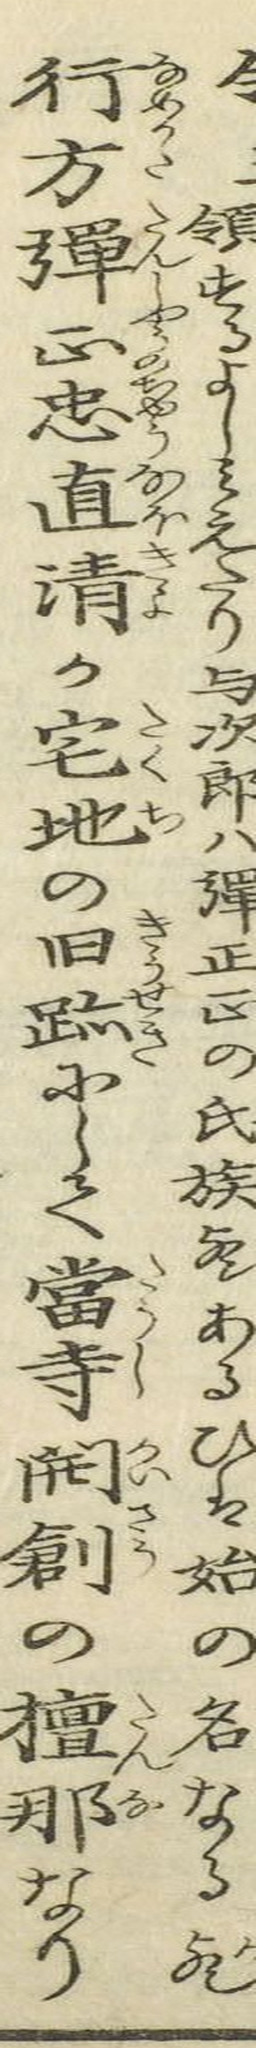行方彈正忠直清か宅地の旧跡にして當寺開創の檀那なり
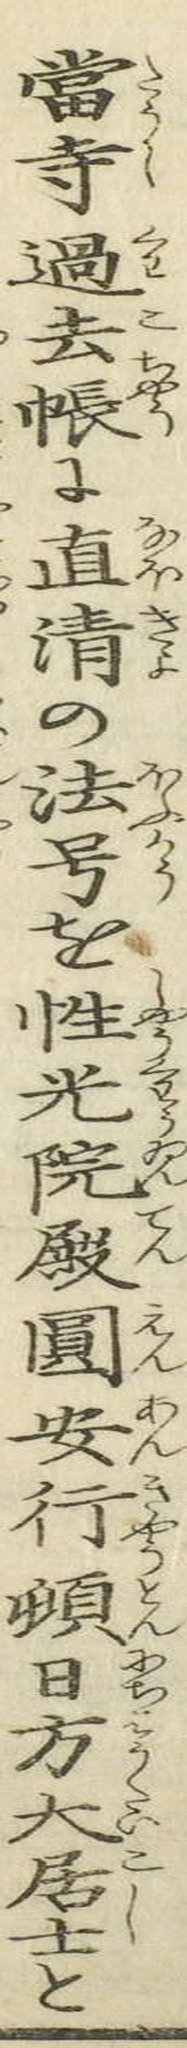當寺過去帳に直清の法号を性光院殿圓安行頓日方大居士と
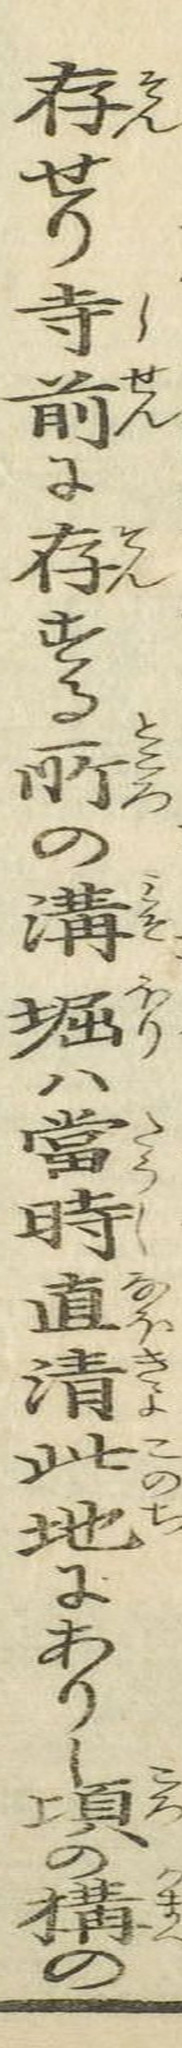存せり寺前に存する所の溝堀は當時直清此地にありし頃の搆の
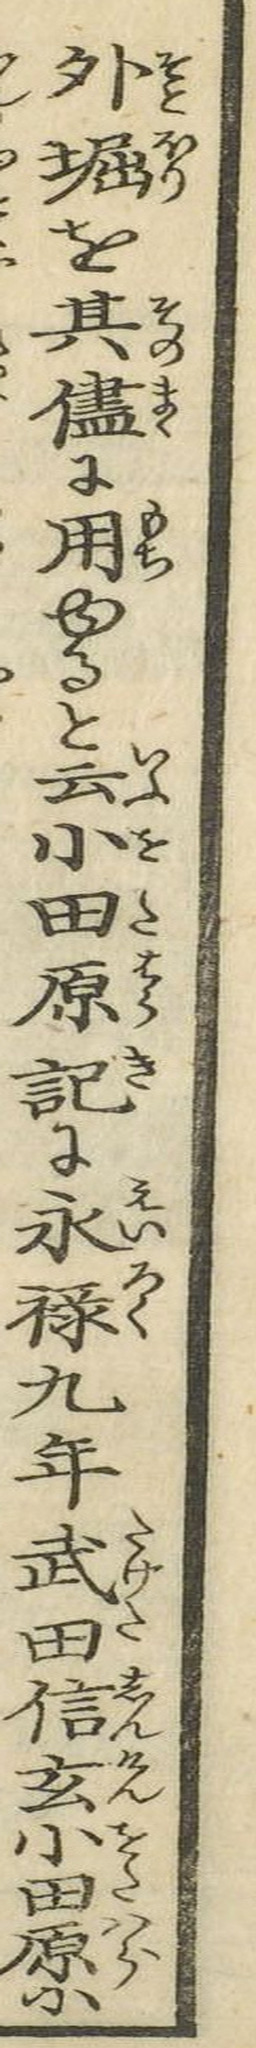外堀を其儘に用ゆると云小田原記に永禄九年武田信玄小田原に
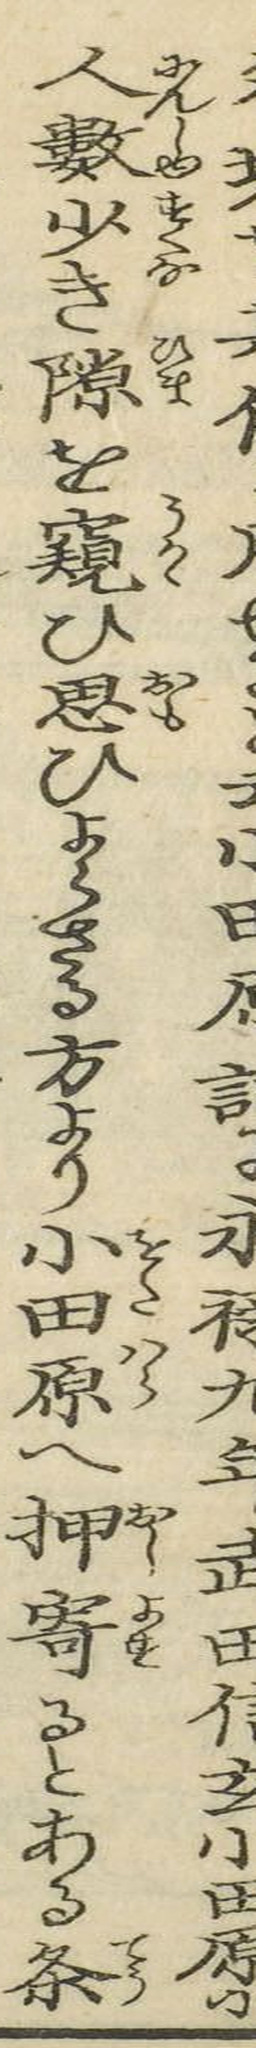人數少き隙を窺ひ思ひよらさる方より小田原へ押寄るとある条
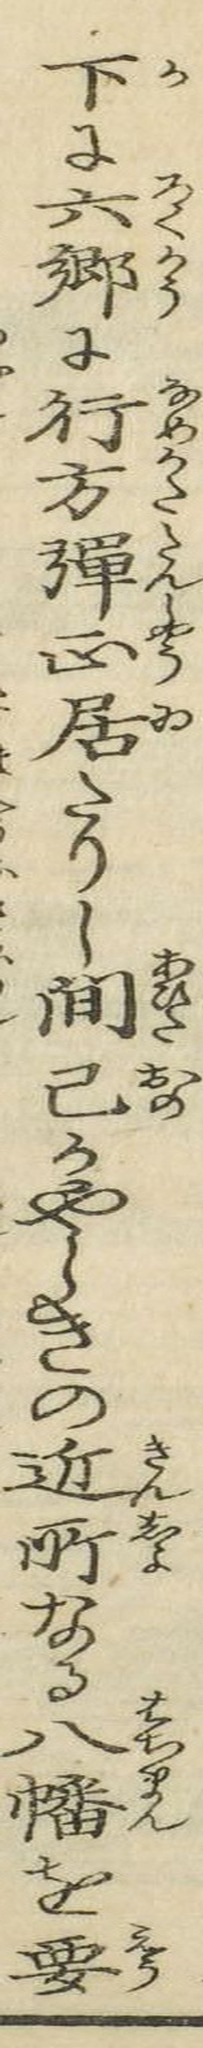下に六郷に行方彈正居たりし間己かやしきの近所なる八幡を要
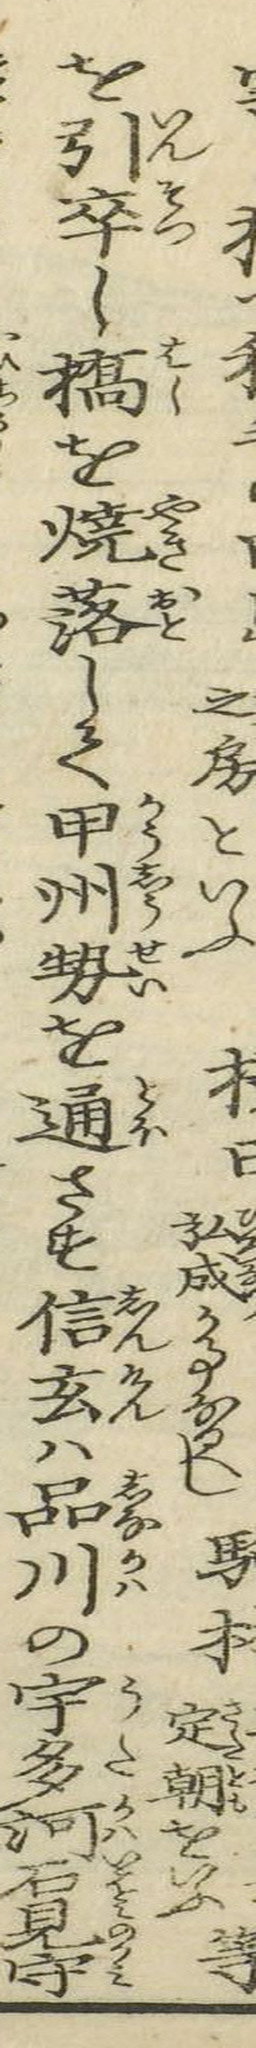を引卒し橋を焼落して甲州㔟を通さす信玄は品川の宇多河石見守
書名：江戸名所図会 20巻 巻之4
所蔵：東京学芸大学教育コンテンツアーカイブ
